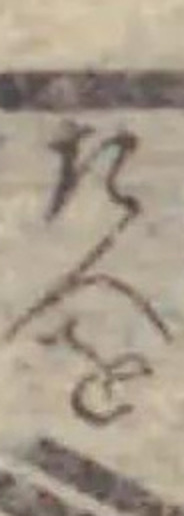たへを

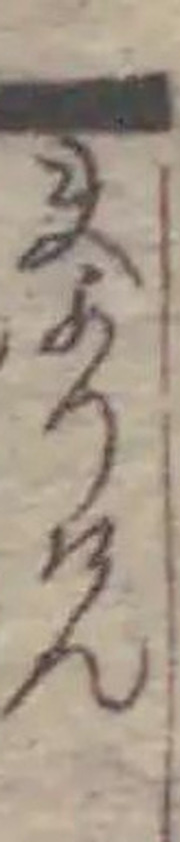夫よりけん
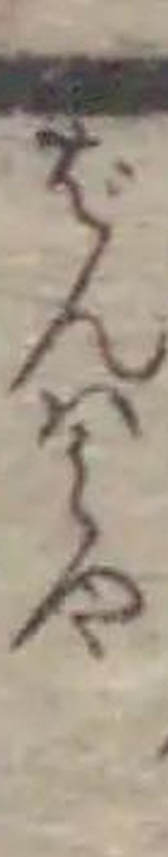ばんはみや
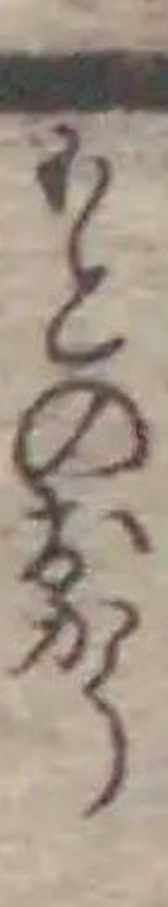もとのおかう
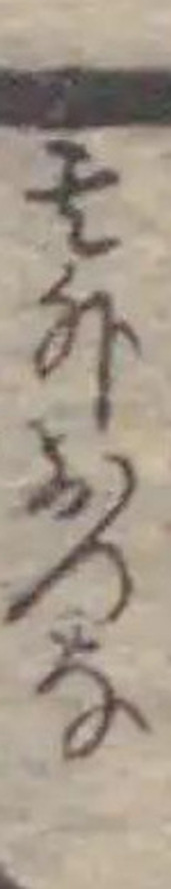其外おつな
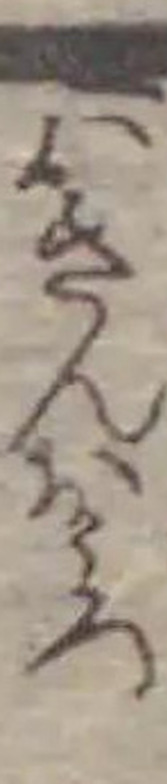おきんおみつ
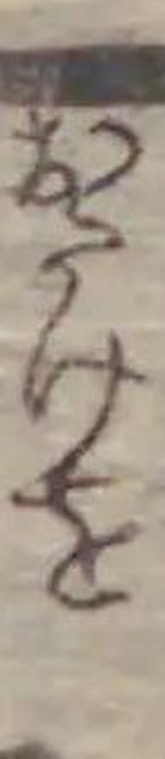おたけを
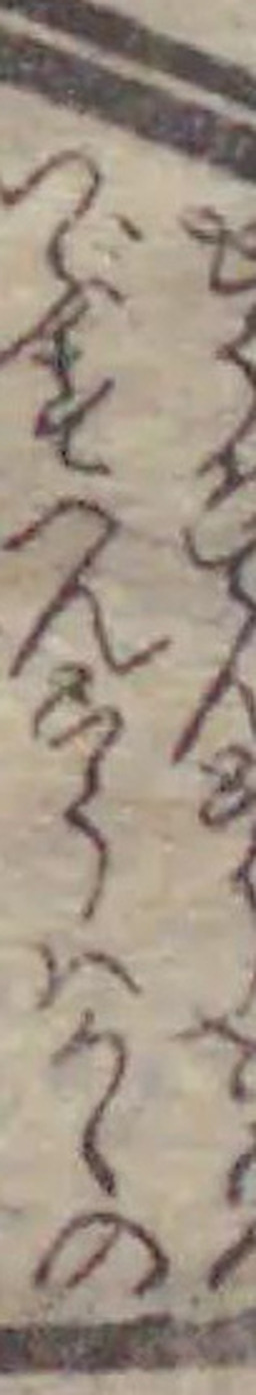つぶすへんとうはかくの
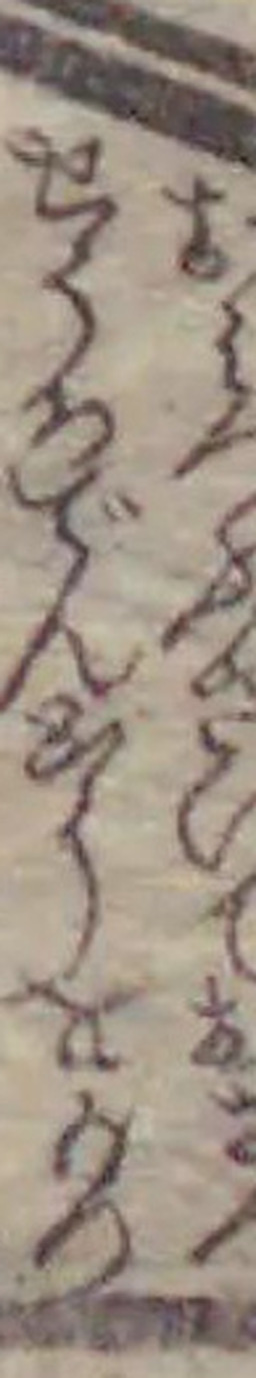せうかでんとうをもり
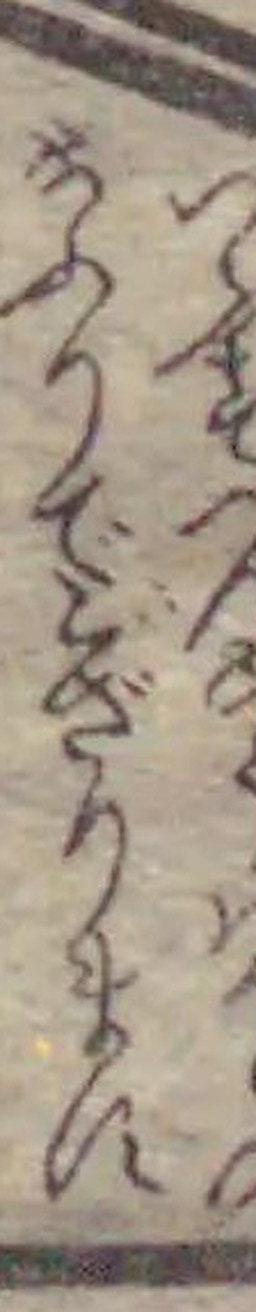とふりでござります
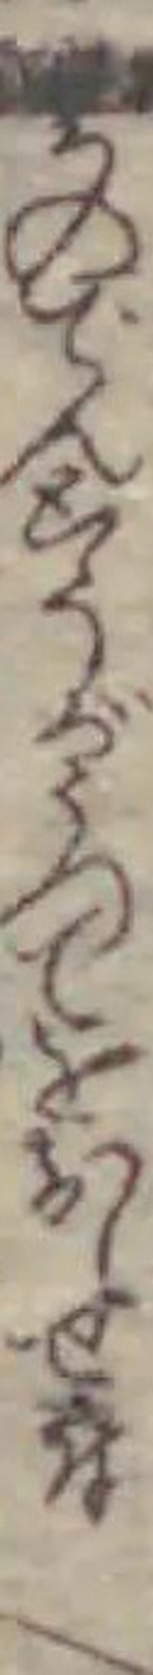かのでんとうがうつてをおゝせ付
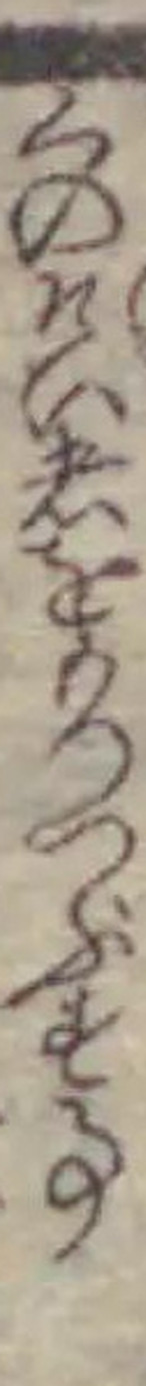くのげい者をもりつぶす事
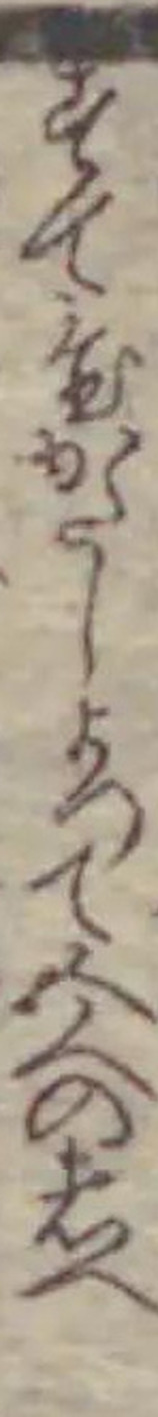すて置かたしよつて五人の者へ
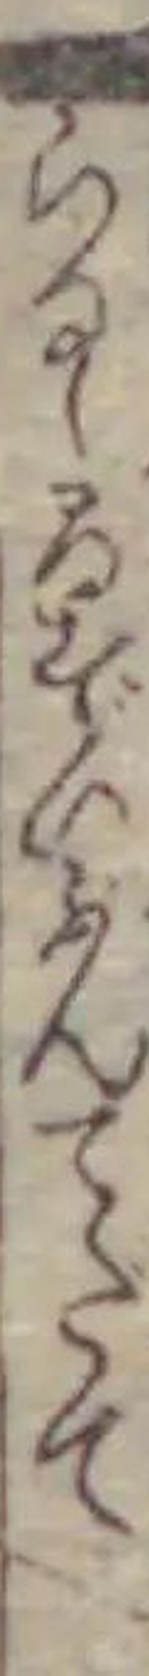らるゝ間ずいぶんてたて

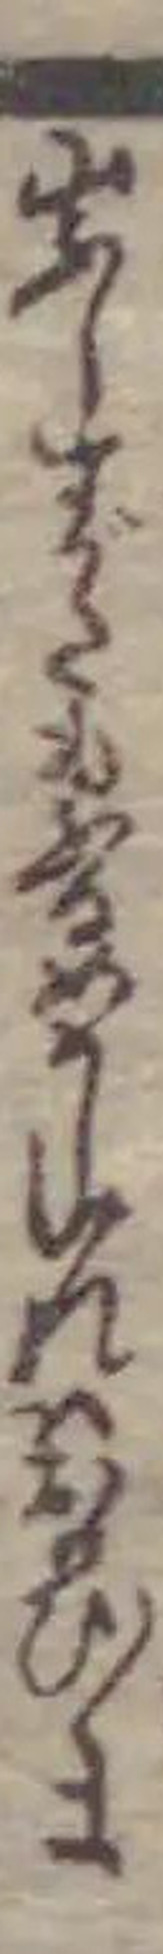山ふしすがたもふるめかしけれはおもひ〳〵に
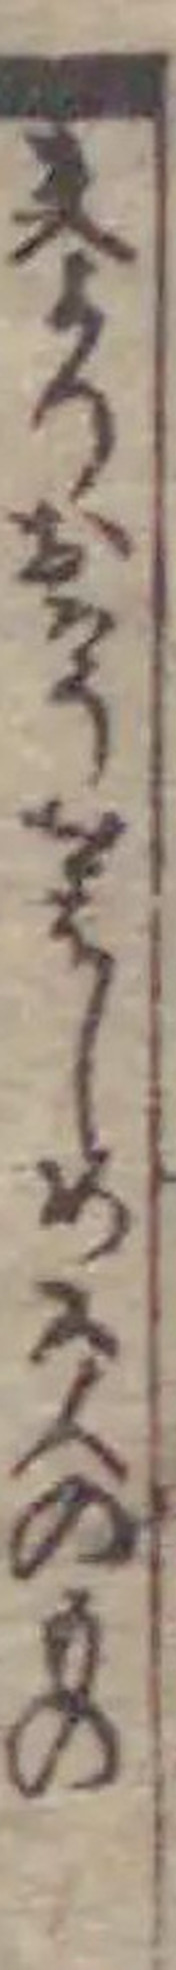夫よりおかうをはしめ五人のもの
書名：藝者五人娘 2巻
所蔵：国立国会図書館 National Diet Library, JAPAN
